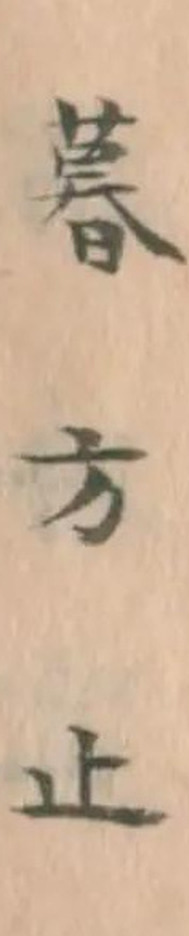暮方止
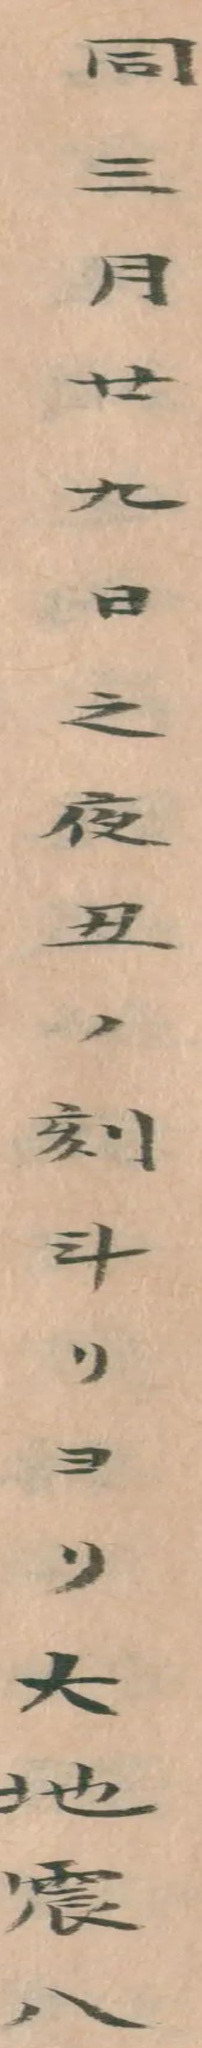一同三月廿九日之夜丑ノ刻斗りヨリ大地震八
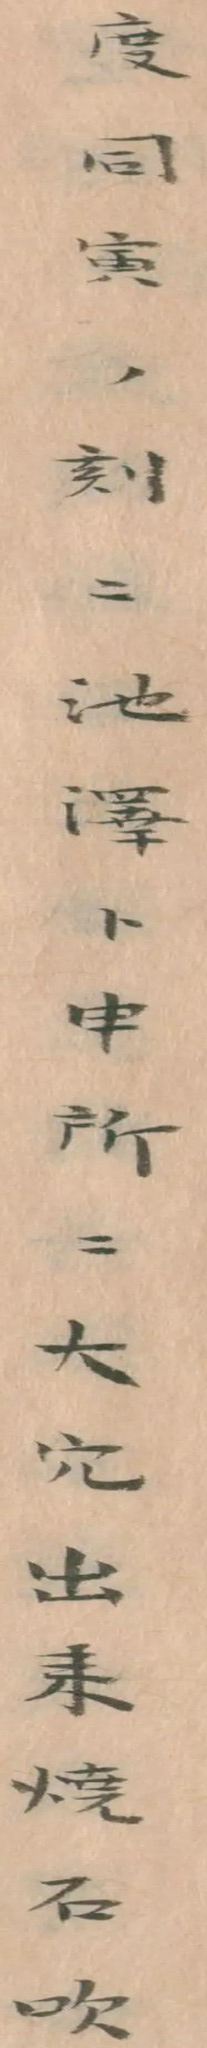度同寅ノ刻二池澤ト申所二大穴出来焼石吹
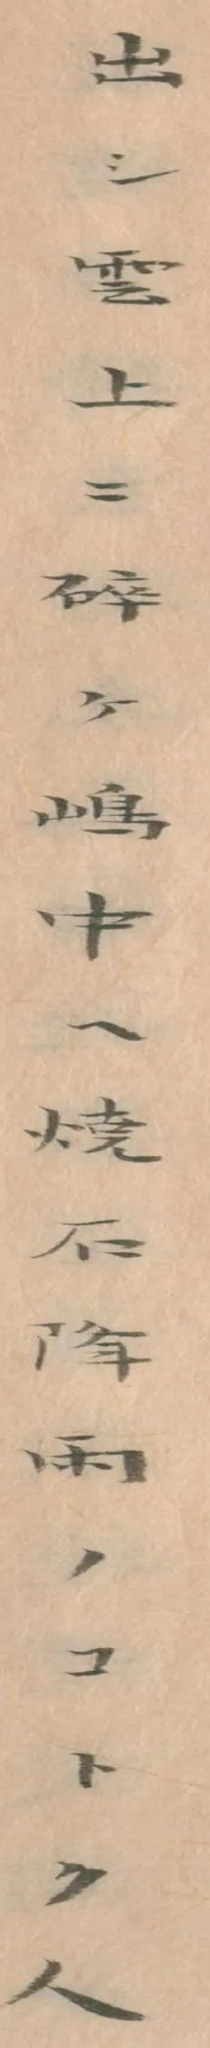出シ雲上二砕ケ嶋中へ焼石降雨ノコトク人

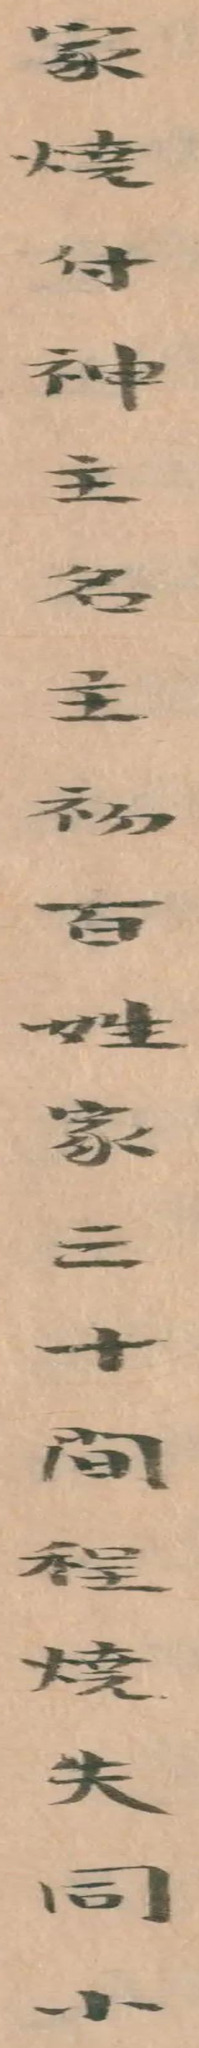家焼付神主名主初百姓家三十間程焼失同小
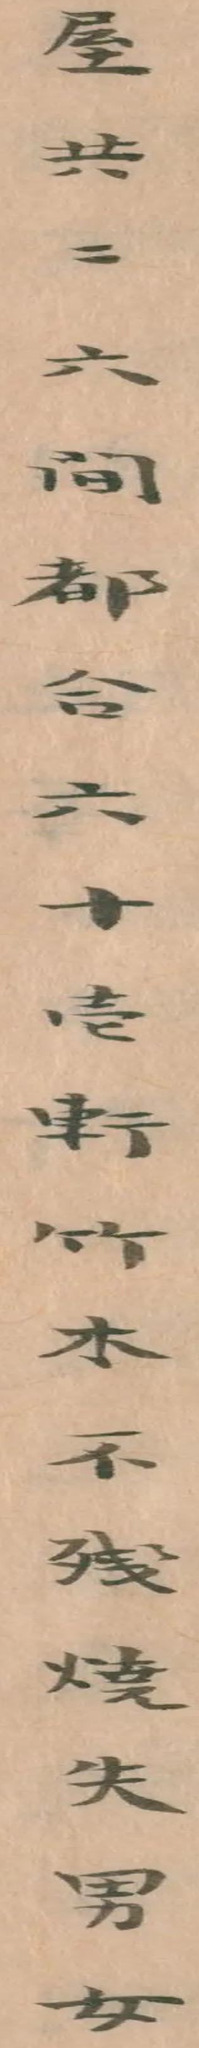屋共二六間都合六十壱軒竹木不残焼失男女
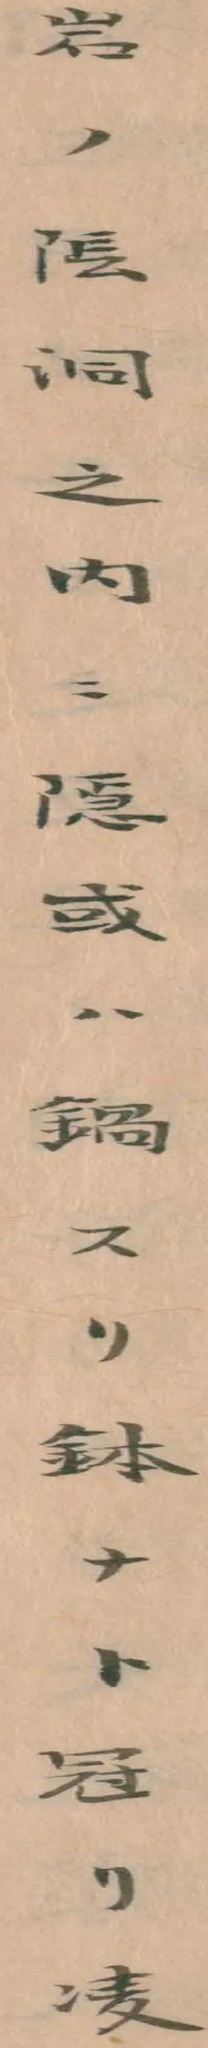岩ノ陰洞之内二隠或ハ鍋スリ鉢ナト冠リ凌
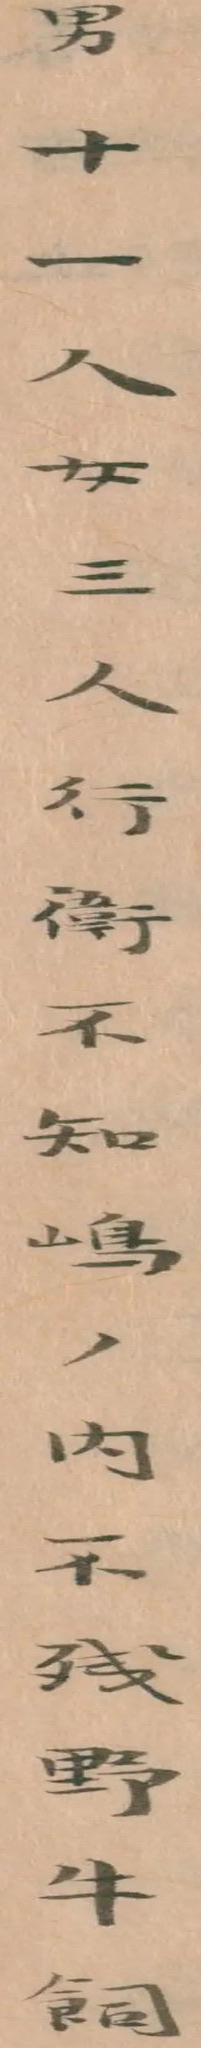男十一人女三人行衛不知嶋ノ内不残野牛飼
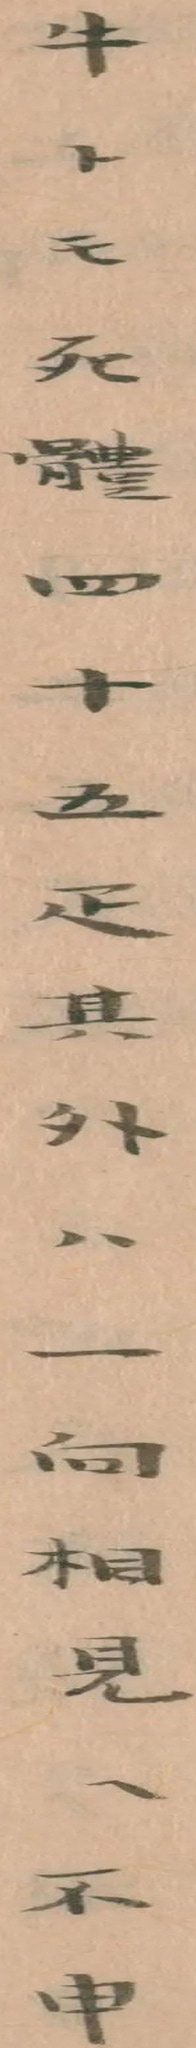牛トモ死体四十五疋其外ハ一向相見へ不申
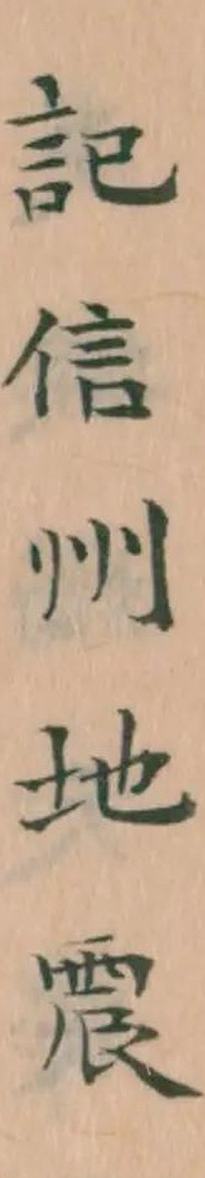記信州地震
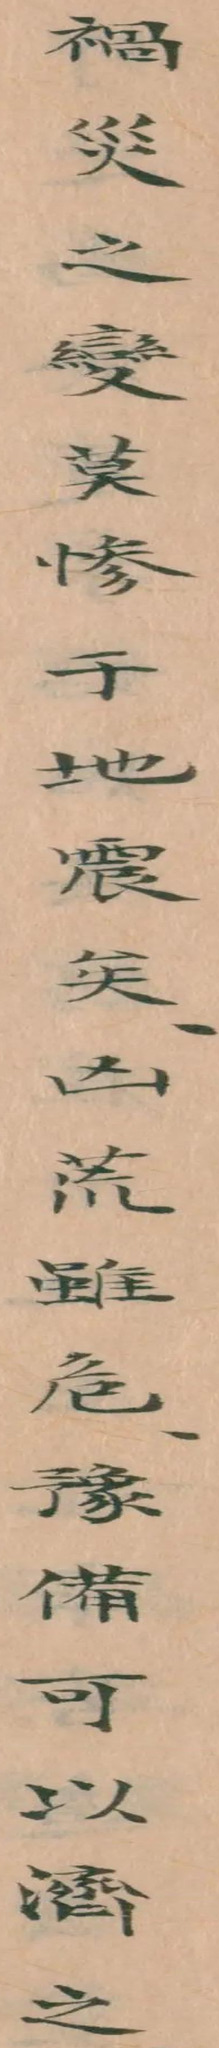禍災之変莫惨干地震矣凶荒雖危豫備可以済之
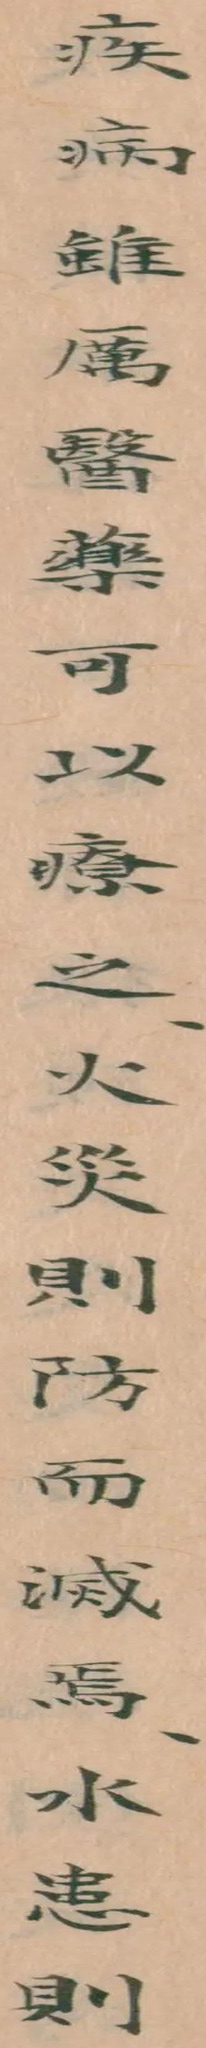疾病錐厲医薬可以療之火災則防而滅焉水患則
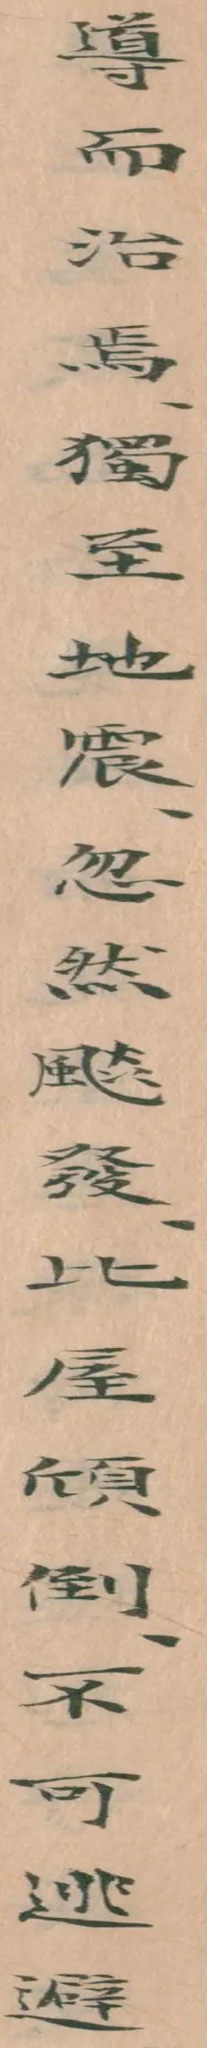導而治焉独至地震忽然颷発比屋傾倒不可逃避
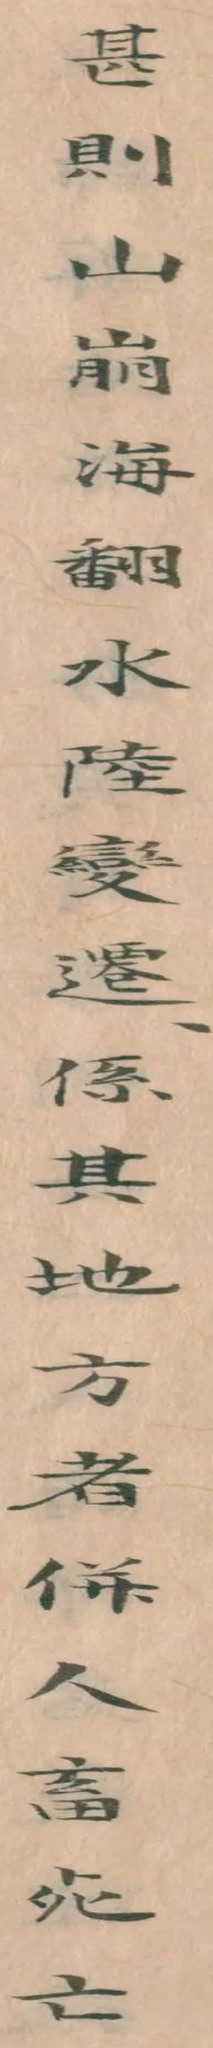甚則山崩海翻水陸変遷係其地方者併人畜死亡
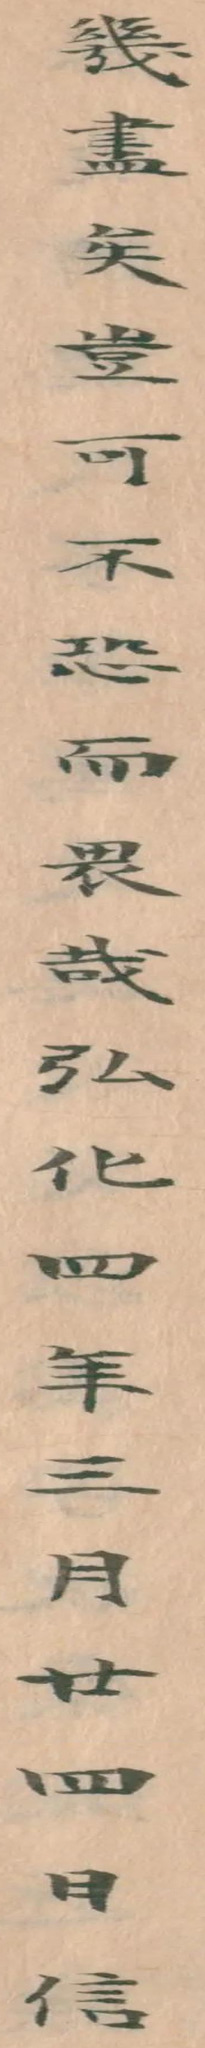幾盡矣豈可不恐而畏哉弘化四年三月廿四日信
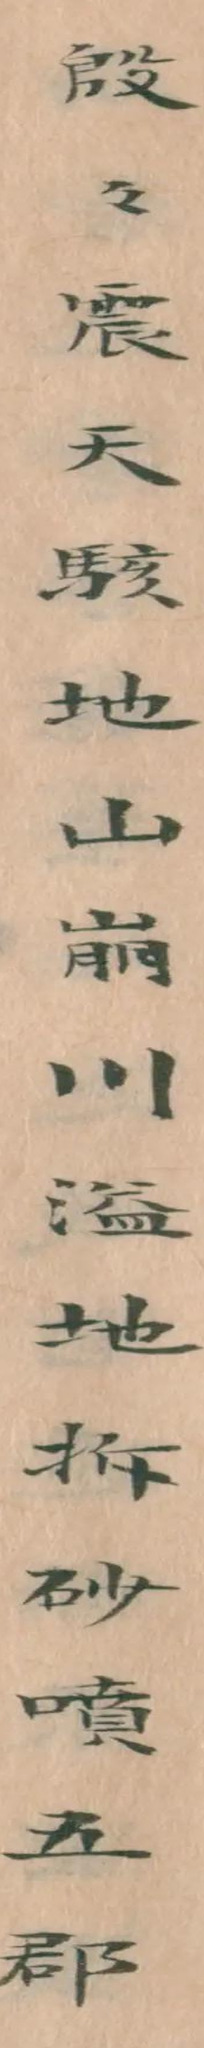州地大震天駭地山崩川溢地坼砂噴五郡
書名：地災撮要. 巻1(噴火山・地震ノ部)
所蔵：国立国会図書館 National Diet Library, JAPAN
